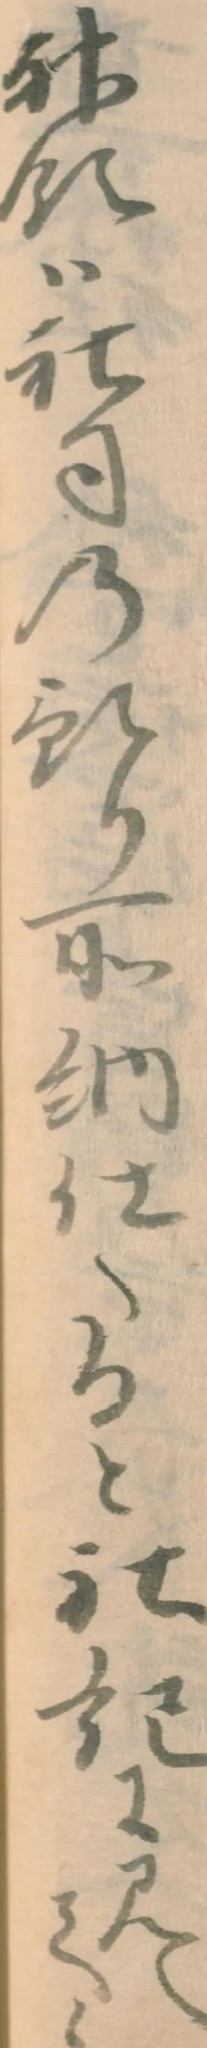神領は社司の預り所納仕たると社記に見えて候
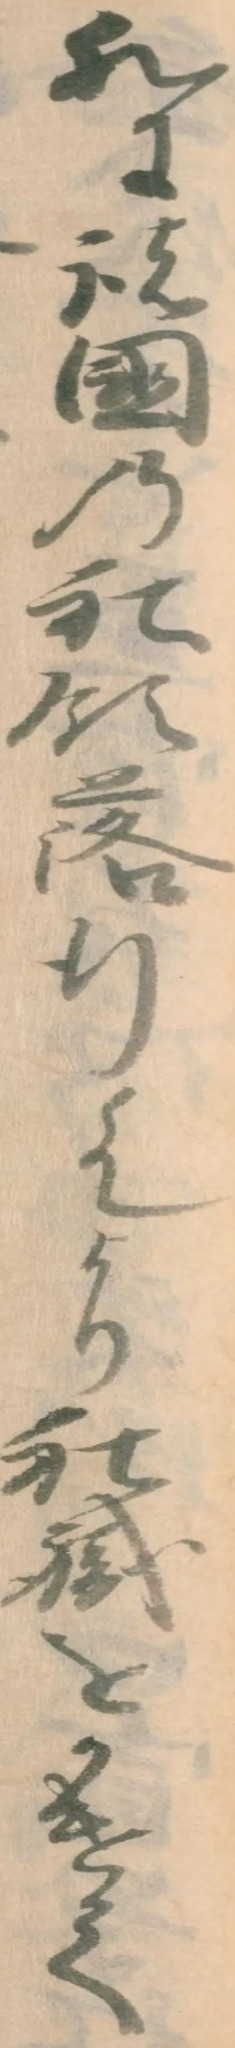然に諸国の社領落行候てより社職をかけて
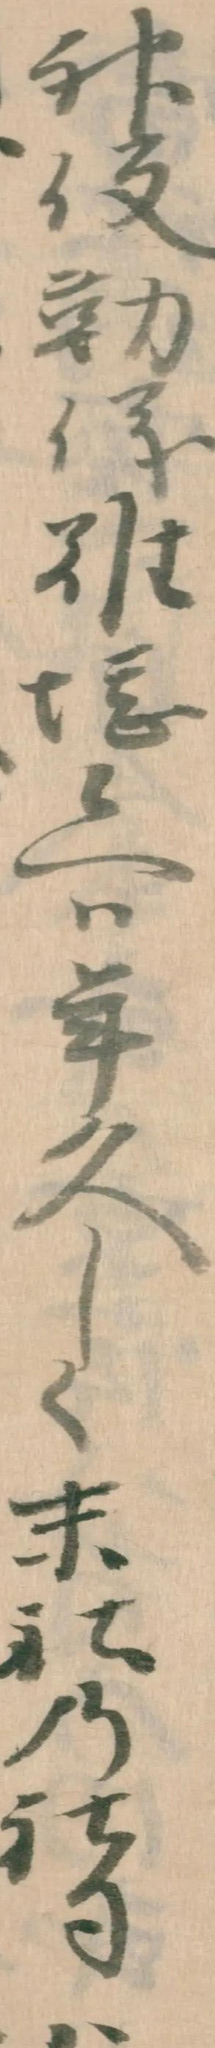神役勤儀難堪候へは年久しく末社の社司は
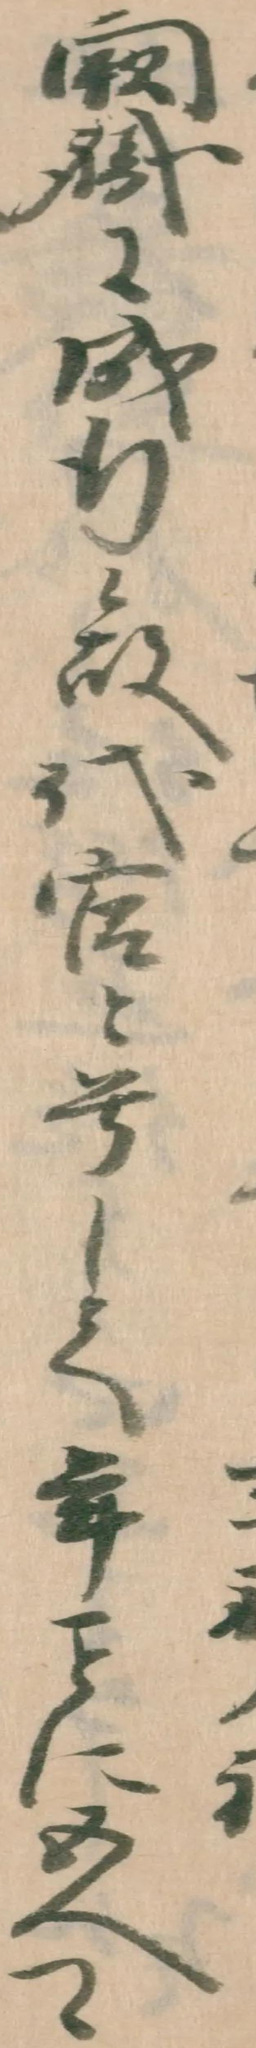闕職に成行候故代官と号して年ことに五人つゝ
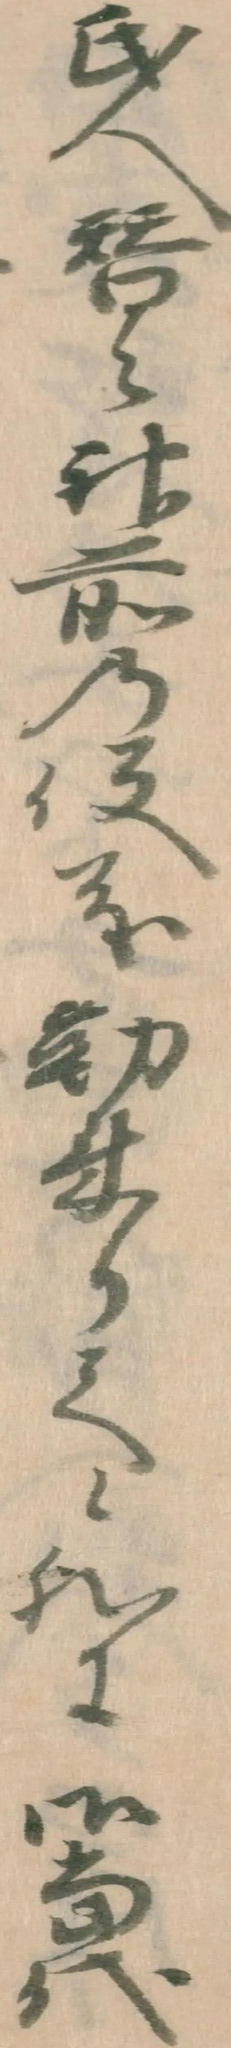氏人替々神前の役義勤来りて候然に御当代
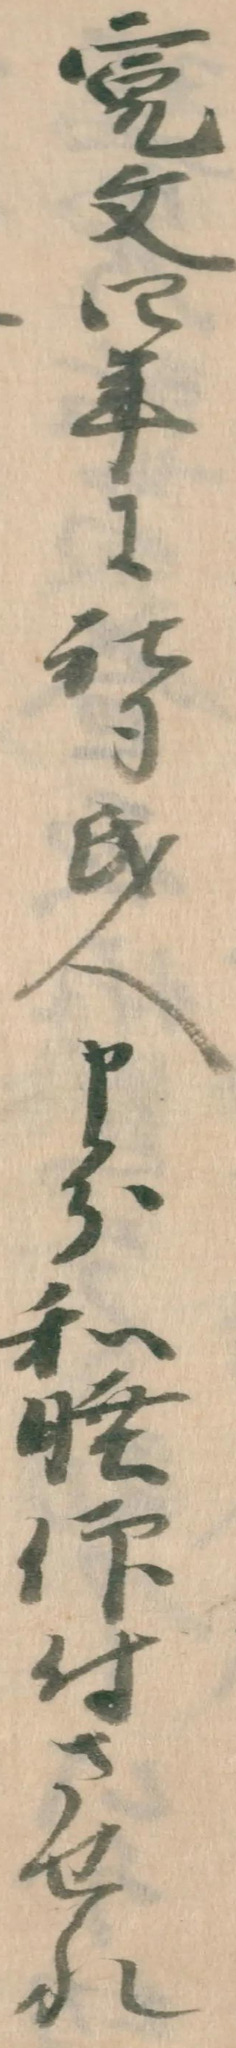寛文四年に社司氏人申分和睦仰付させられ
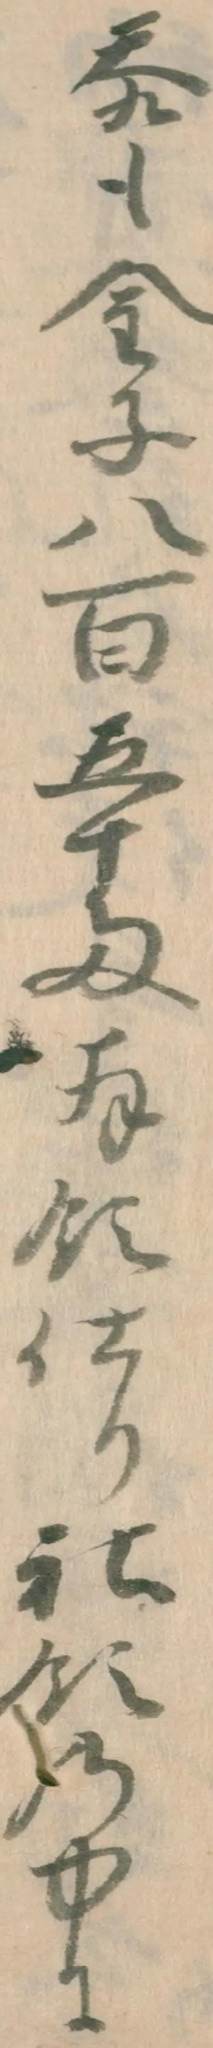忝も金子八百五十両拝領仕り社領の中に
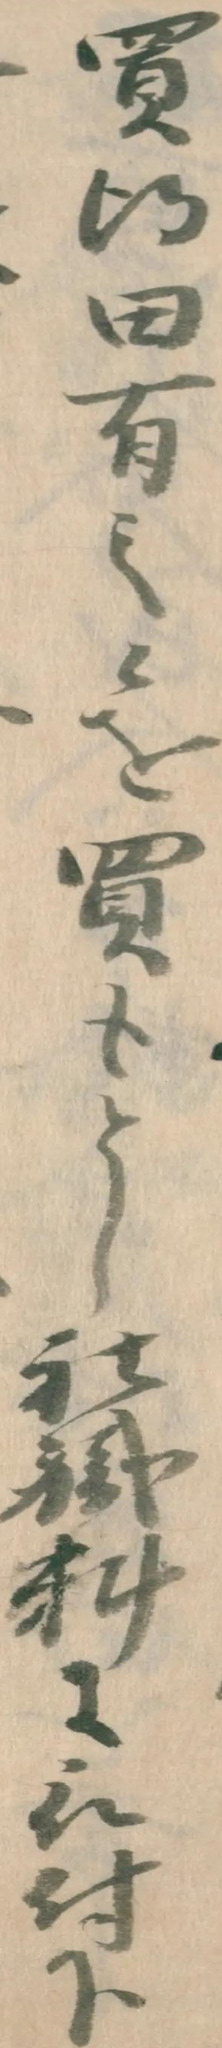買得田有之候を買もとし社職料に被付下
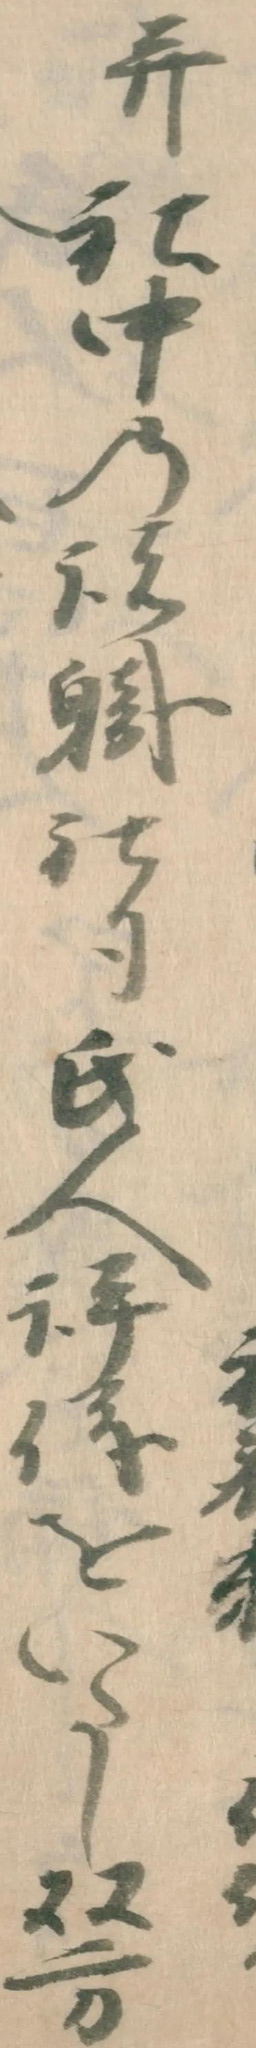并社中の諸職社司氏人評議をいたし双方
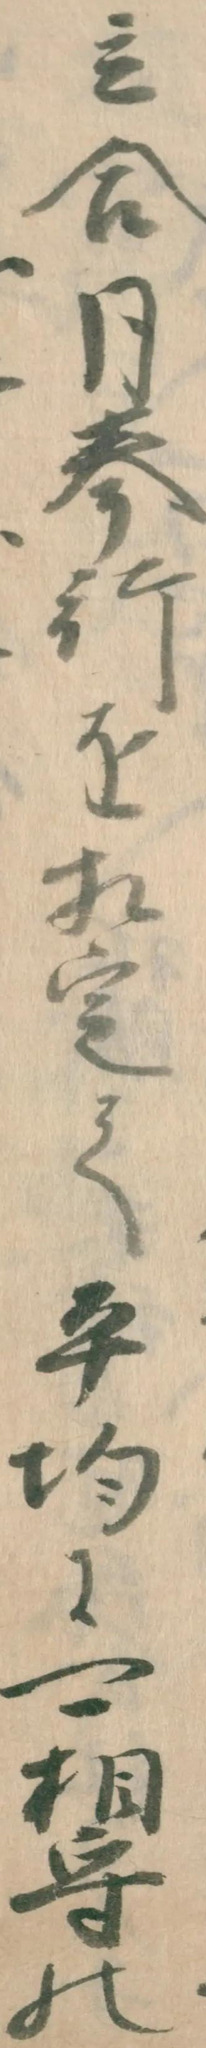立合月奉行を相定て平均に可相守の
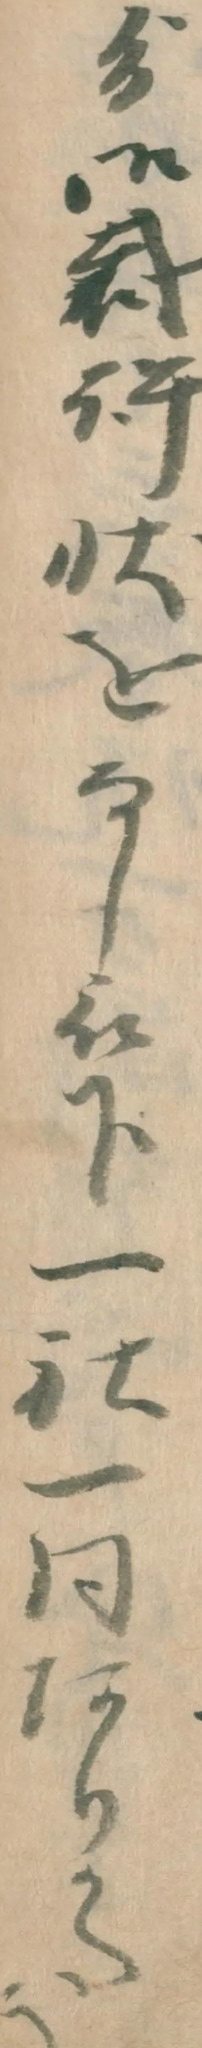分御裁許状をなし被下一社一同ありかたき

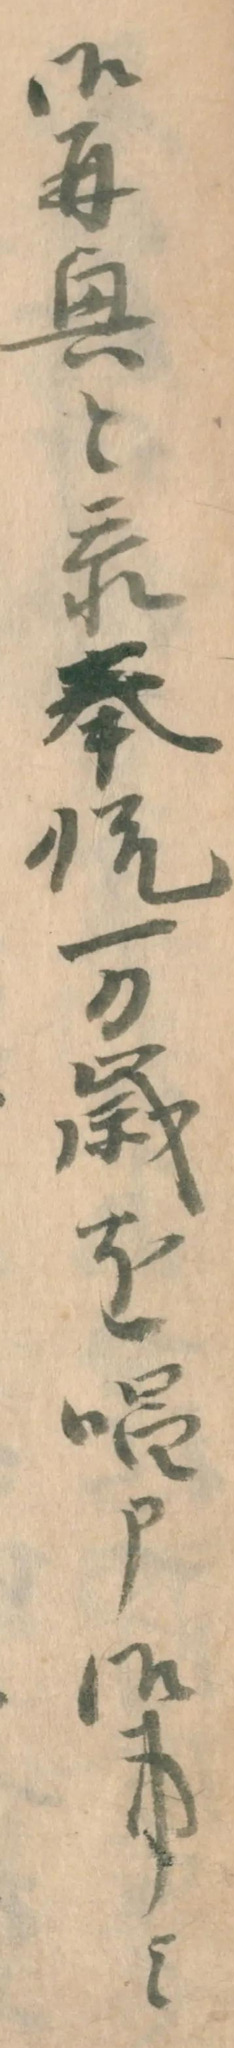御再興と忝奉悦万歳を唱申御事候
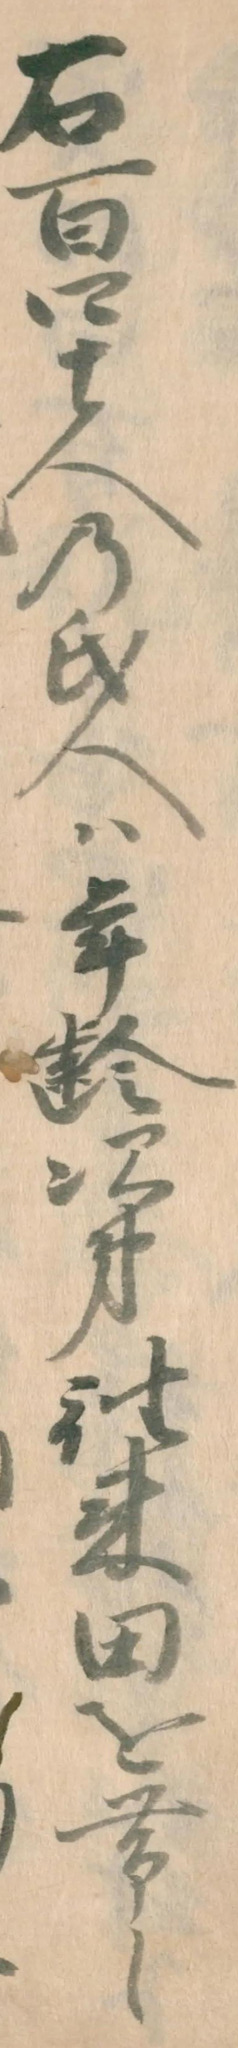右百四十人の氏人は年齢次第往来田を帯し
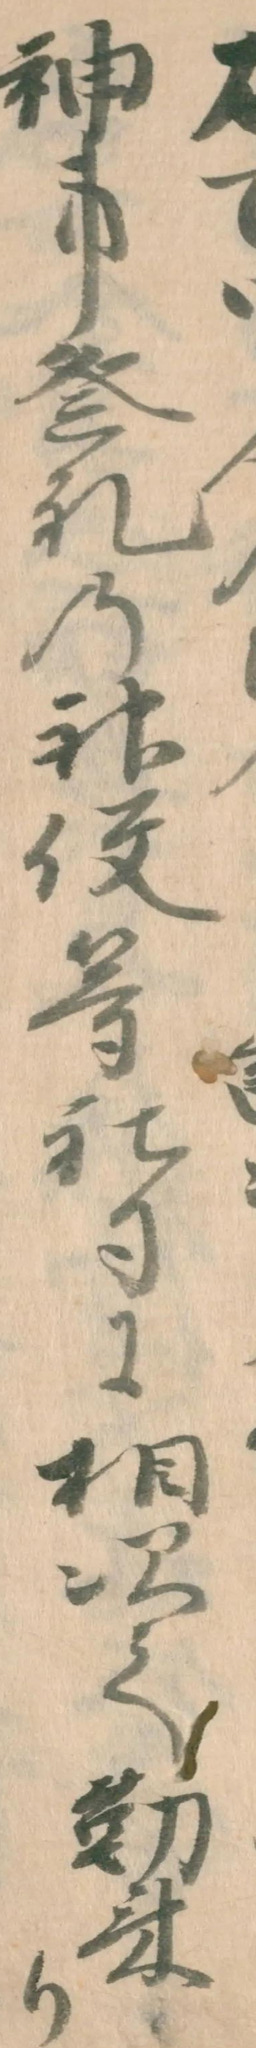神事祭礼の神役等社司に相次て勤来り
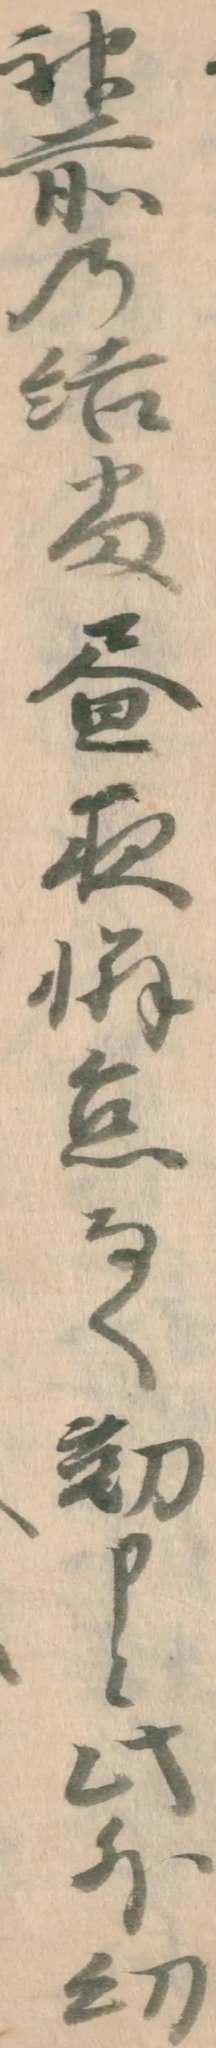神前の結番昼夜懈怠なく勤申候此外幼
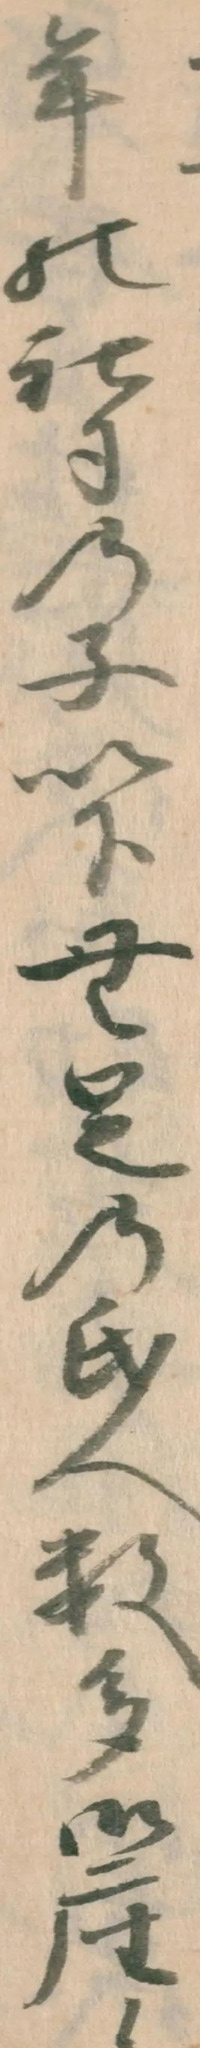年の社司の子以下無足の氏人数多御座候
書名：賀茂社記録. 第1冊
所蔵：国立国会図書館 National Diet Library, JAPAN
